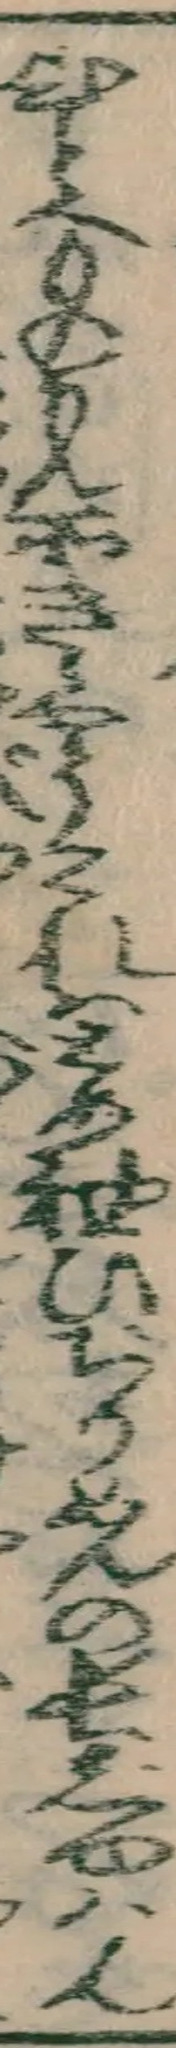ひとへものもん所きゝやうくれはとめ袖ひぢりめんの長じゆはん
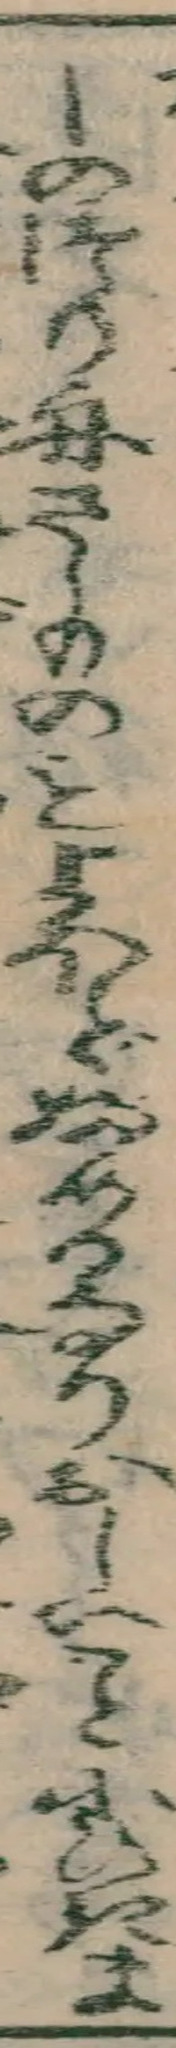しのつり舟さしものもよほどふめるなりおしいことにひきま
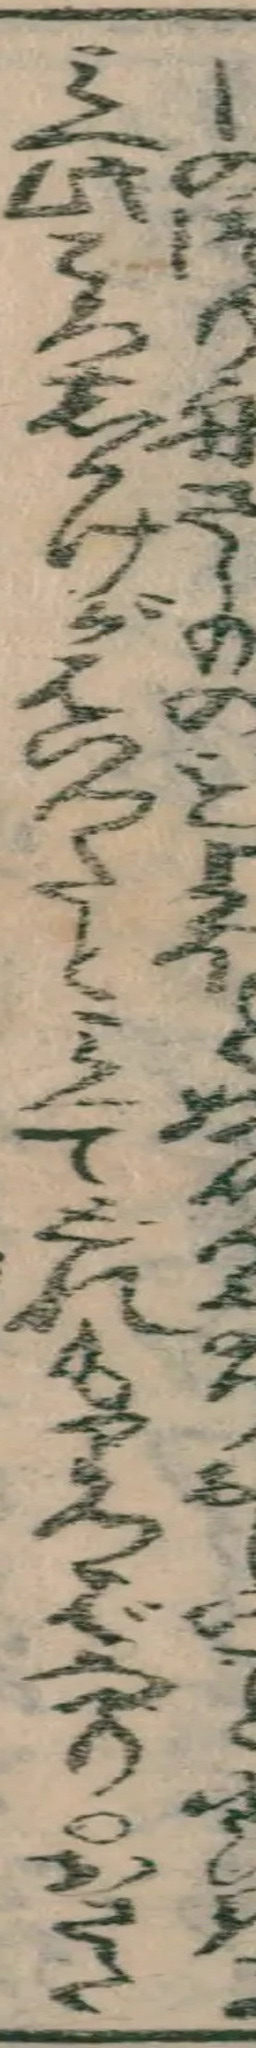みへ此ころしかけがはいつたとみへてとれもまつばなり○おさた
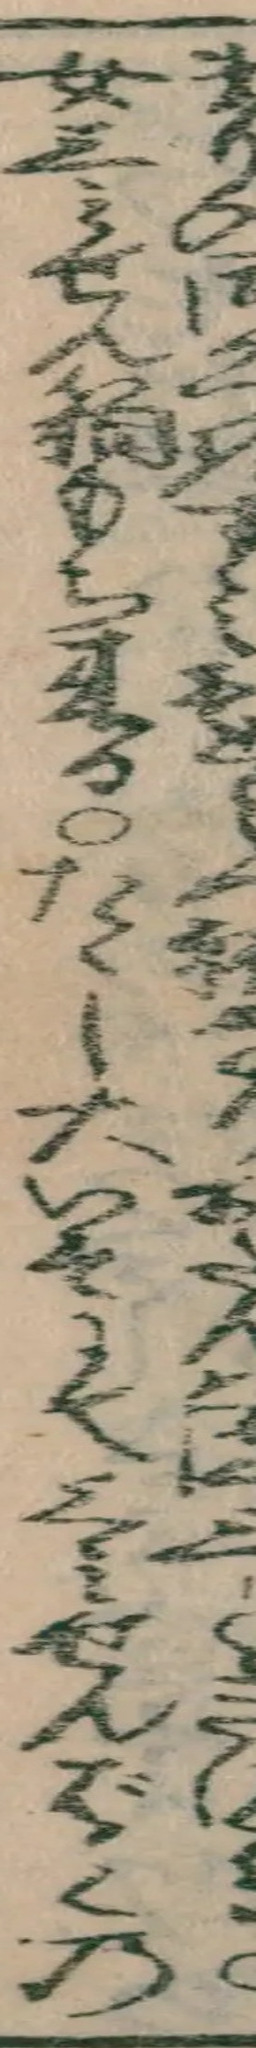女三みせん箱もち来る○たゝし大いそにて三みせんばこの
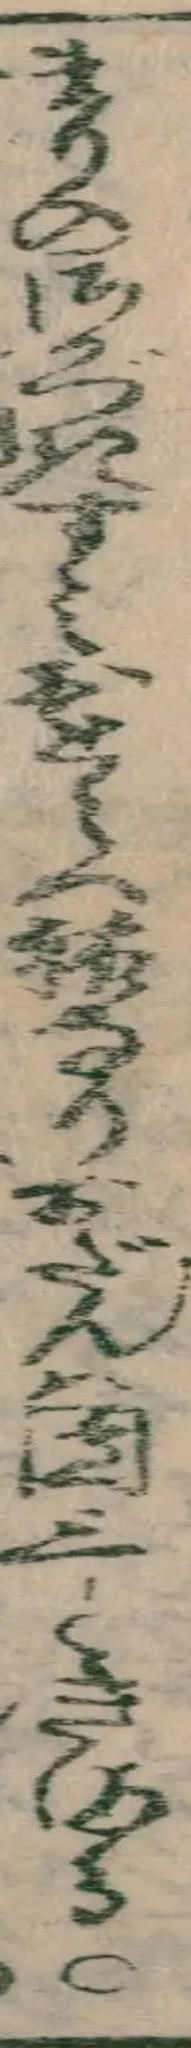まりのさかづきすみおとらは祐なりおだんは団三ときまる○
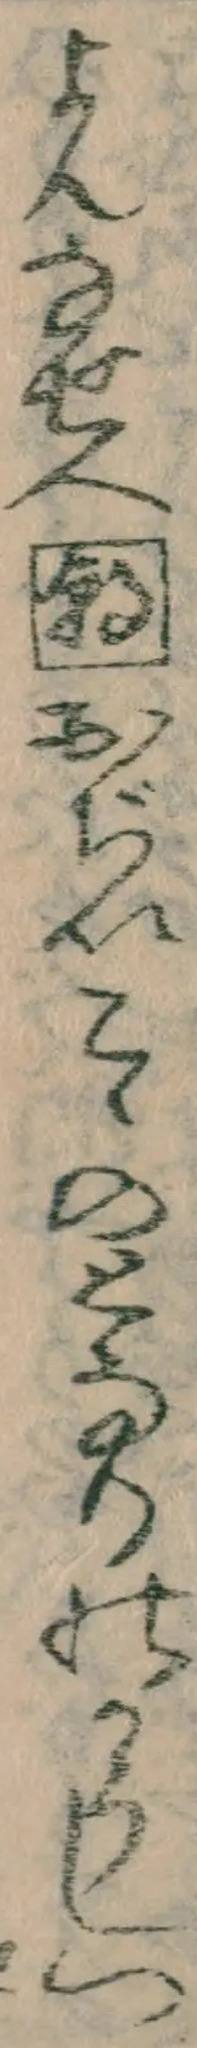よんなせへ〈朝〉おぢいこゝのとなりのかうしつ
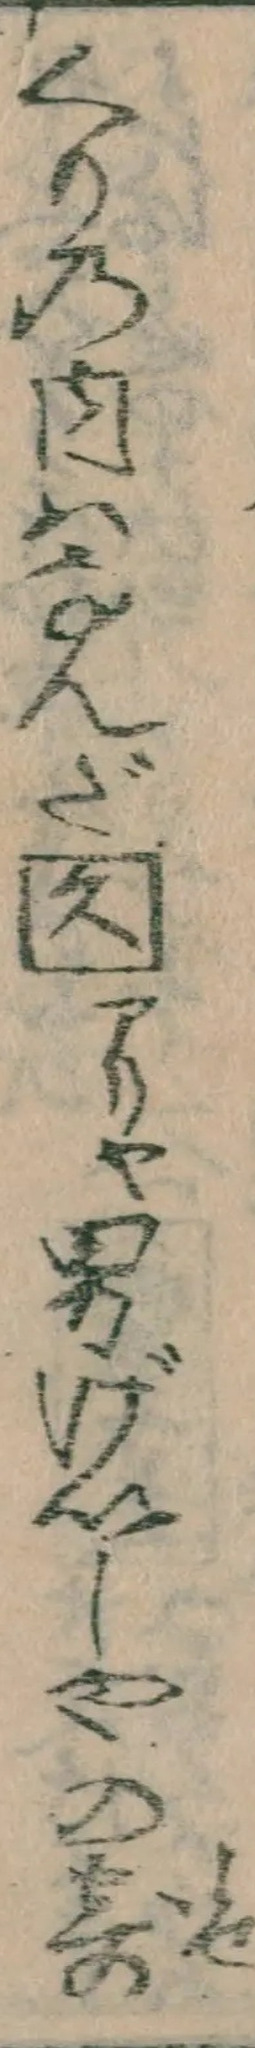くりの内はなんだ〈久〉アリヤ男げいしやの寄
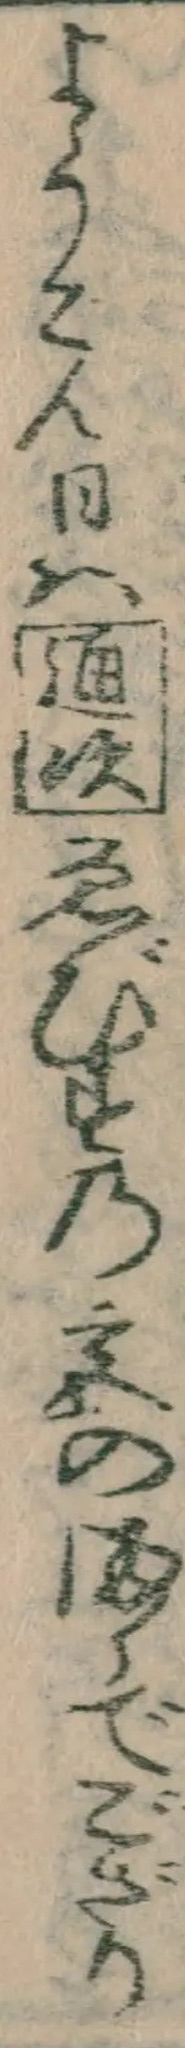ようこん日は〈通次〉ゑびすの宮のまゝでござり
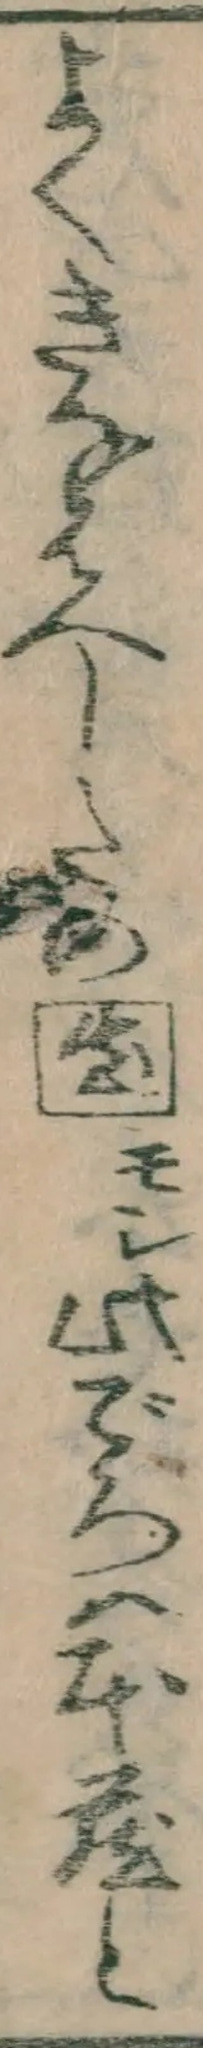よくきなはへしたの〈団〉モシ此ごろは本蔵と
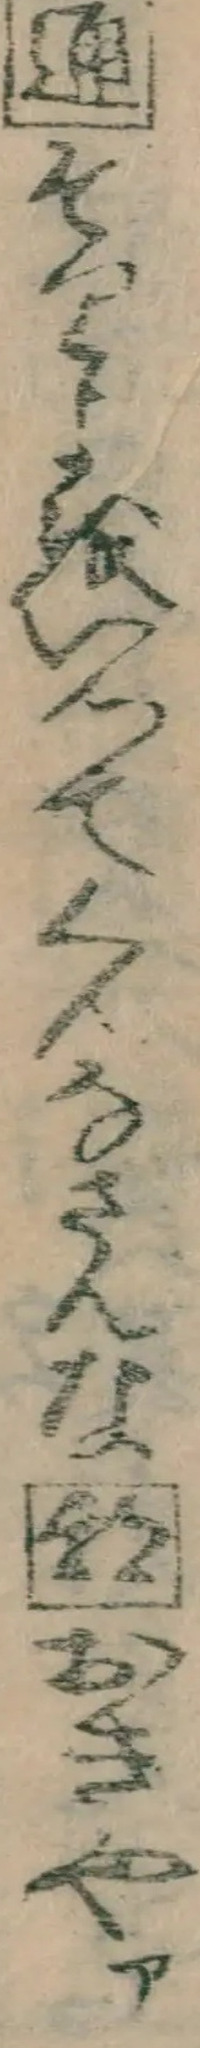〈通〉そりよをいつてくんなさんな〈朝〉おきやァ

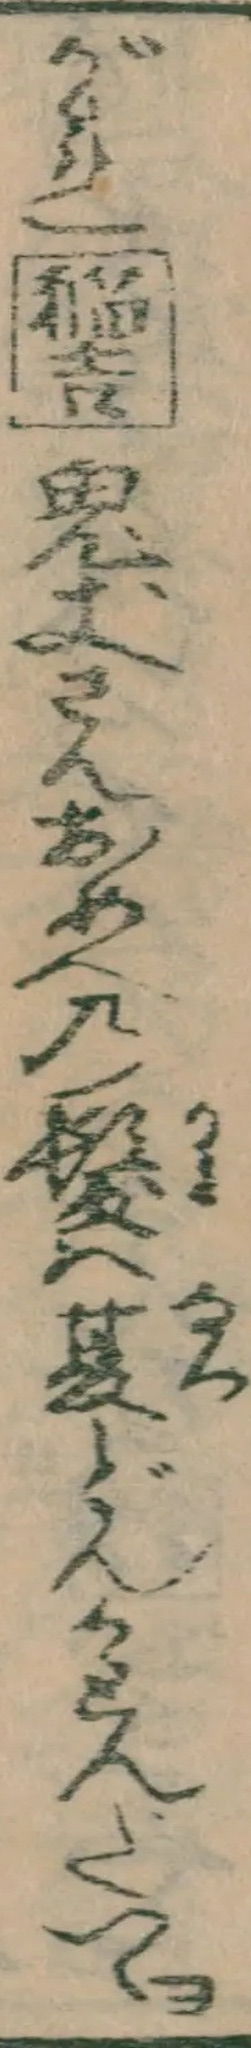がれ〈稲吉〉鬼丈さんおめへの髪は夏どんかとんだいゝヨ
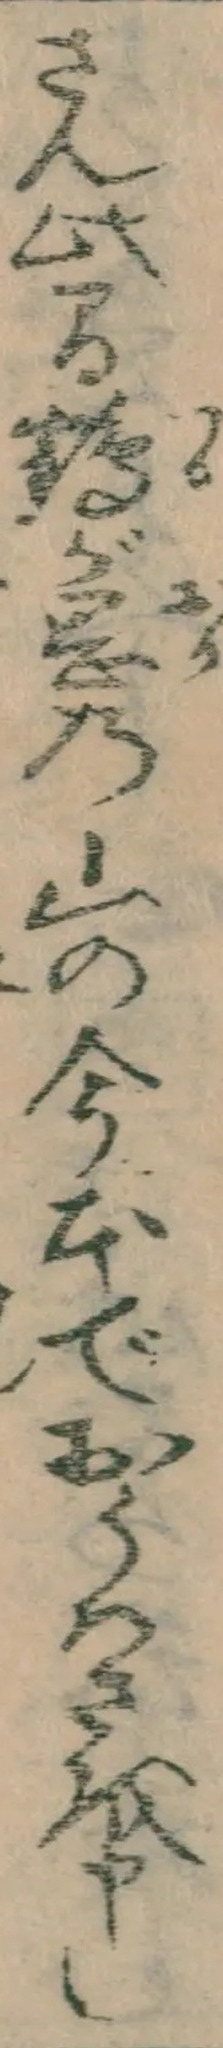さん此間鶴が岡の山の今本でおうはさを申し
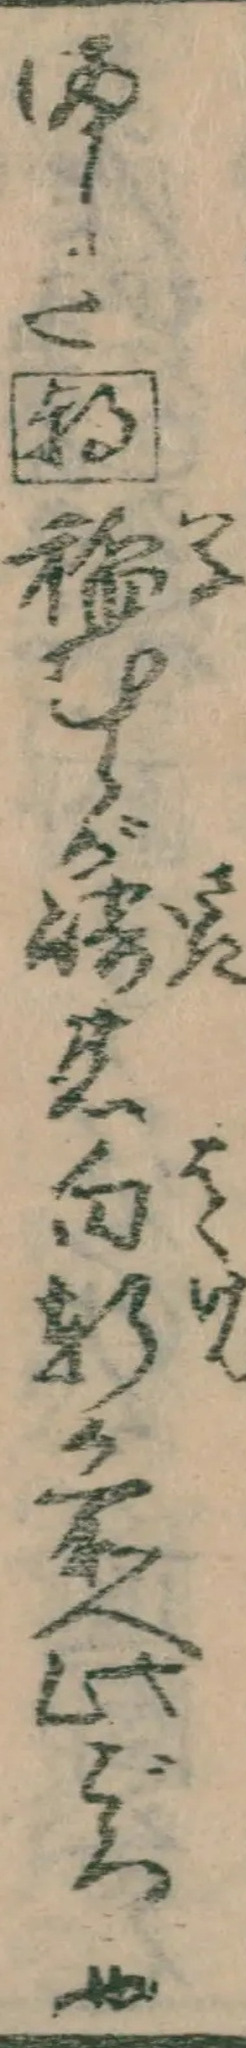ました〈朝〉稲むらが崎の白軒か所へ此ごろ
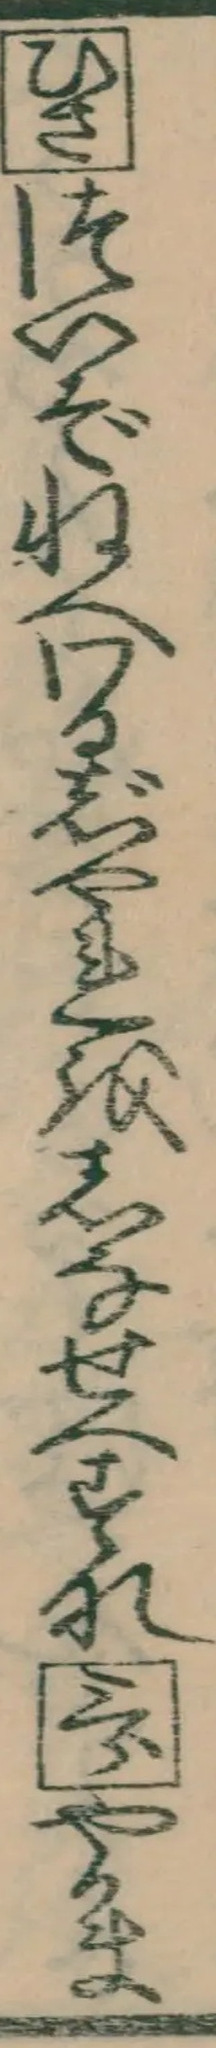〈ひさ〉ついぞねへわるじやれをなせへすな〈三郎〉やかま
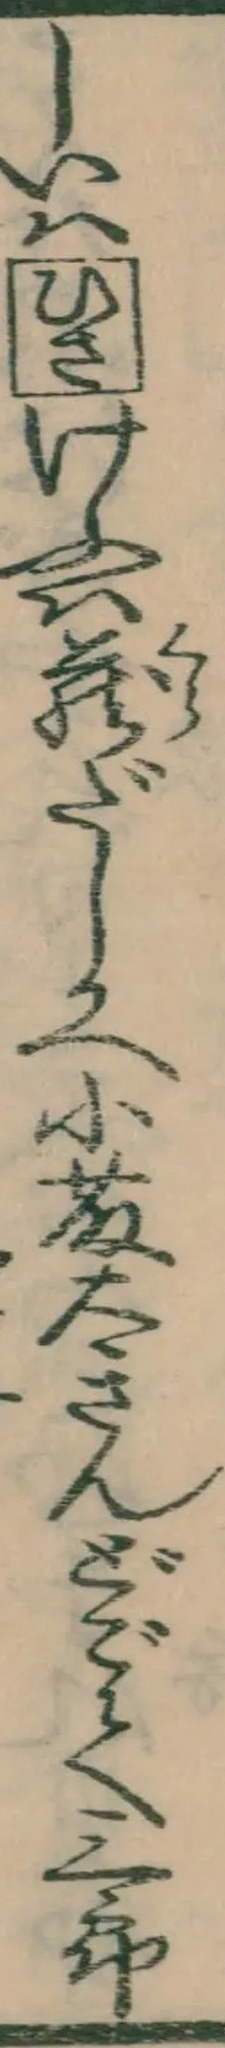しい〈ひさ〉けふは蔵ざしかへ小藤太さんどごて三郎
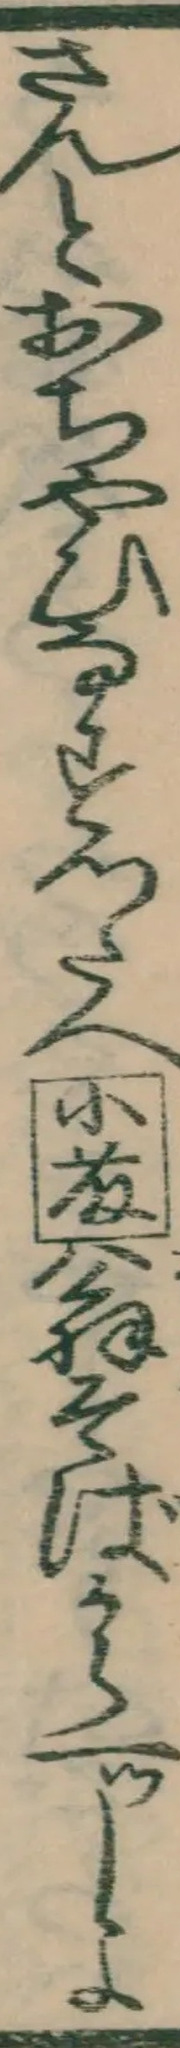さんとおちやひなすつたへ〈小藤〉翁そばから一ツしよ
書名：教訓読本：大礒風俗仕懸文庫
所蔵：国立国会図書館 National Diet Library, JAPAN
